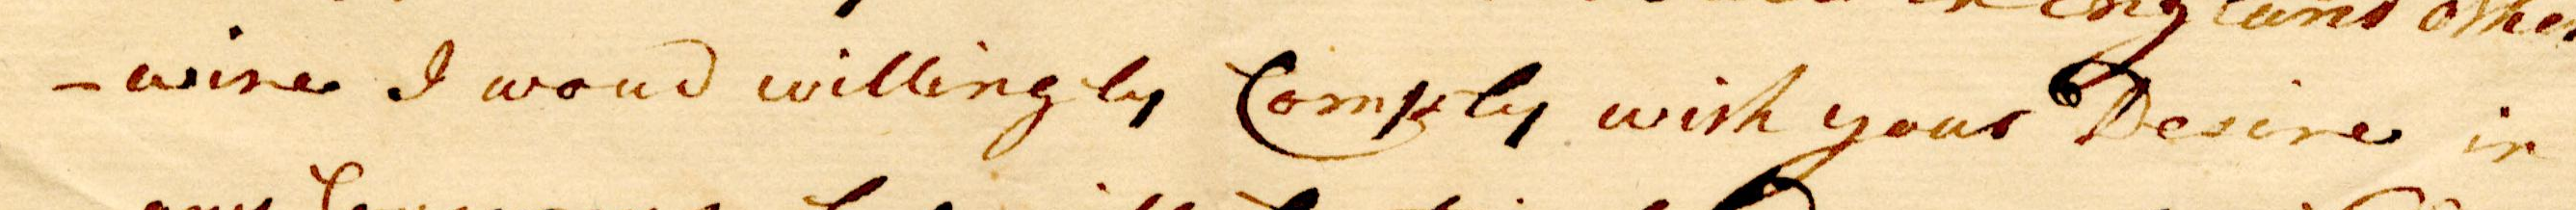-wise I woud willingly Comply wish your Desire in
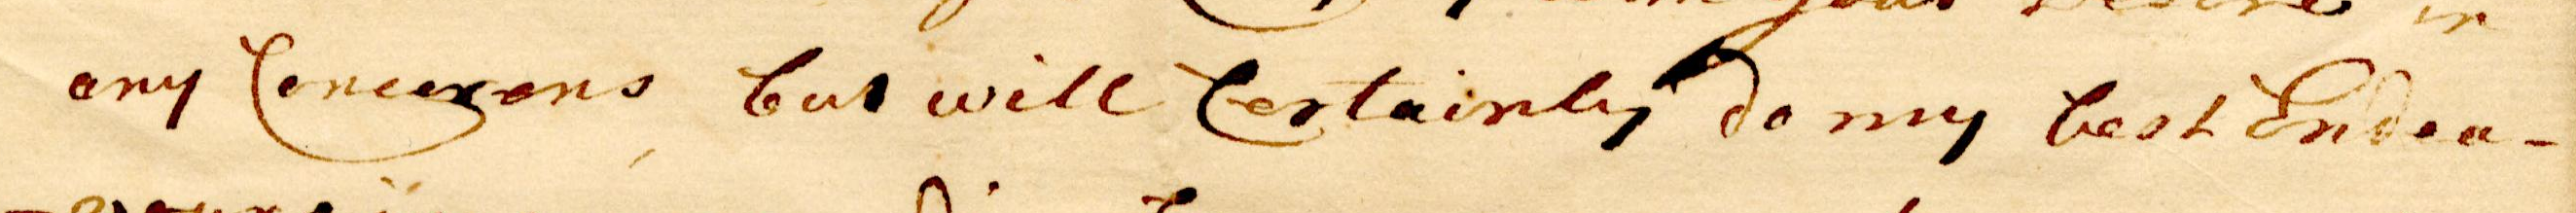any Conexons but will Certainly do my best Endea-
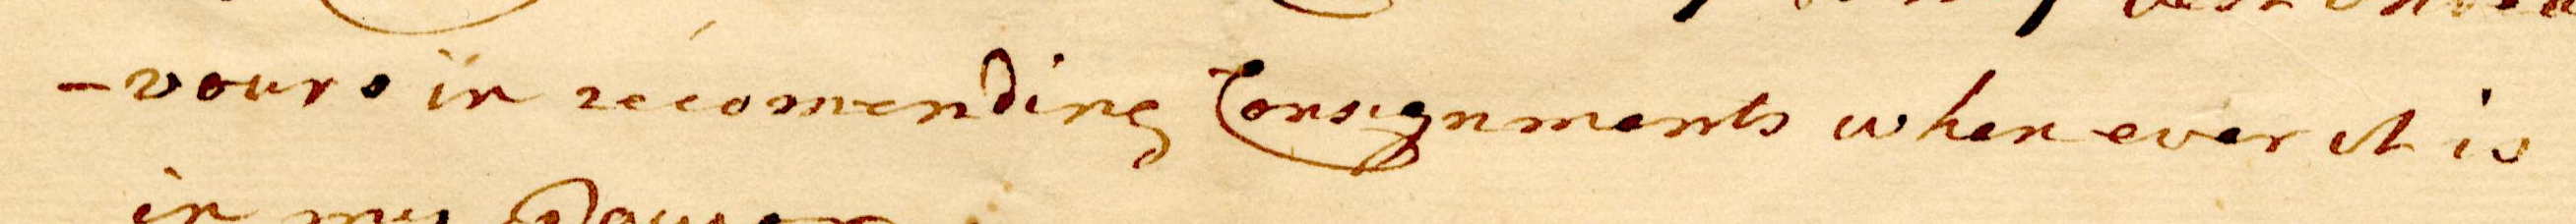-vours in recomending Consignments when ever it is
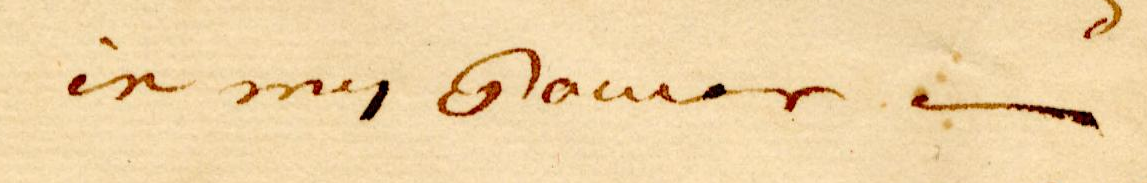in my power-
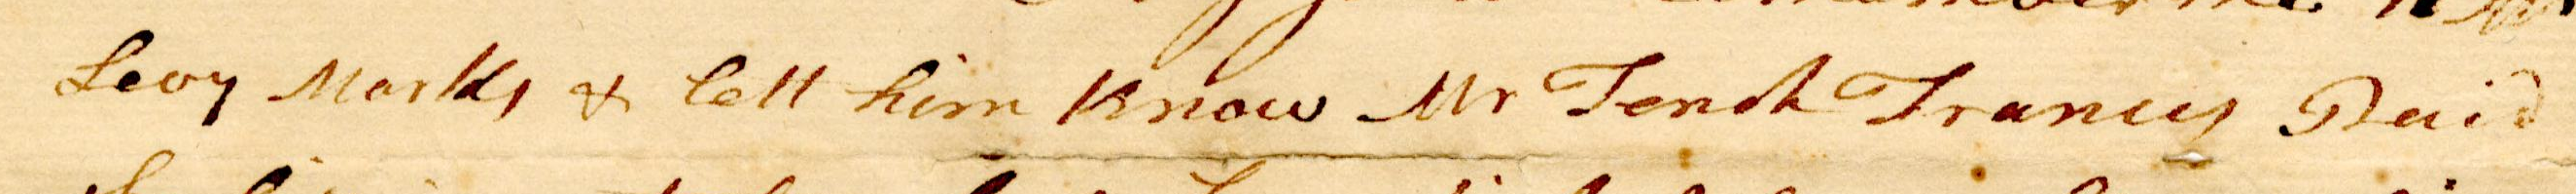Levy Marks & tell him know Mr. Tench Frances Paid
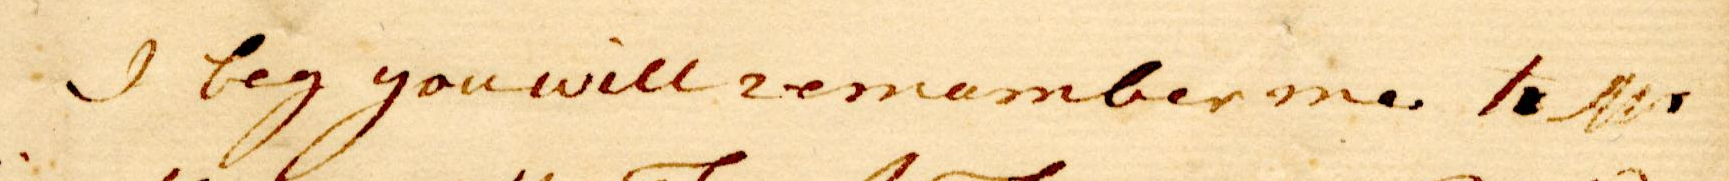I beg you will remember me to M^r
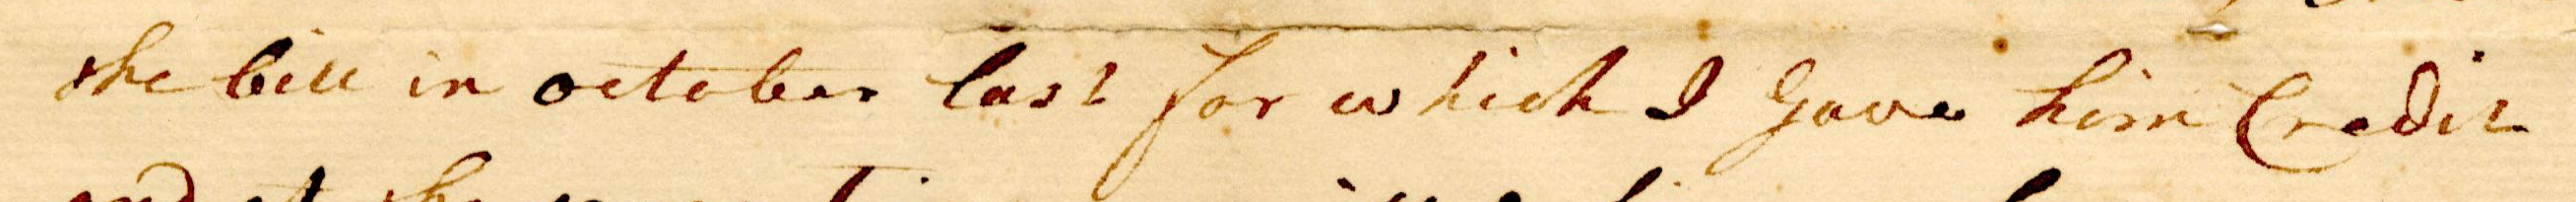the bill in October last for which I Gave him Credit
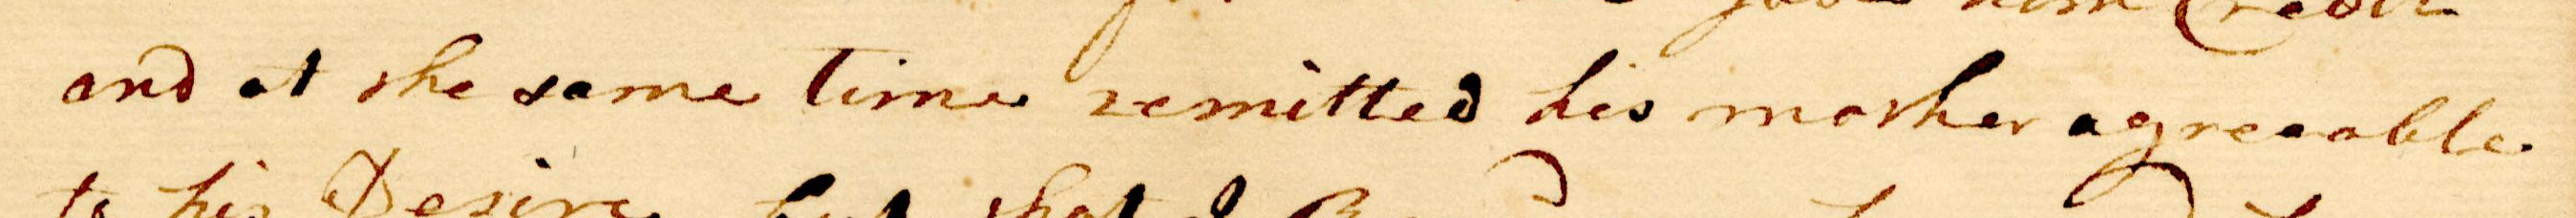and at the same times remitted his mother agreeable
